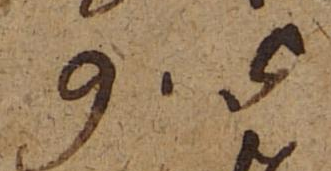5.6
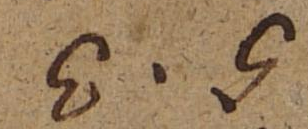5.3
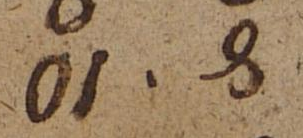8.10
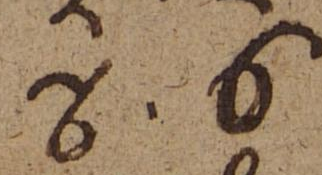9.2
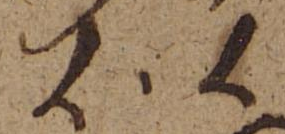7.7
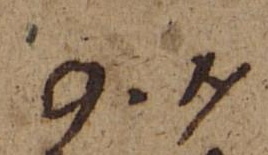4.6
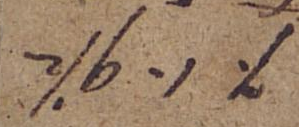7. 1. 9 1/2
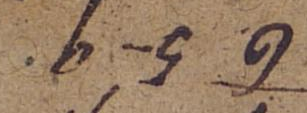6. 5- 9
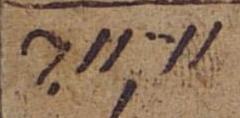1.112
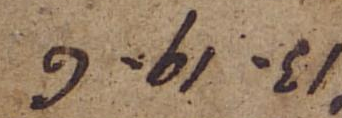13. 19. 6
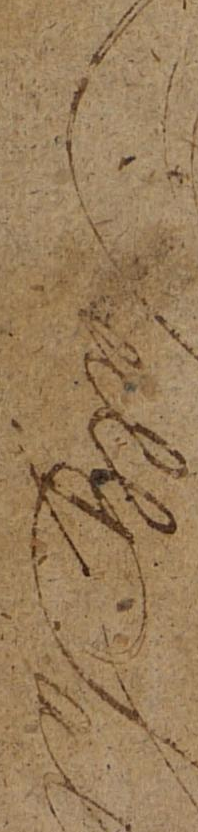Sally Sal
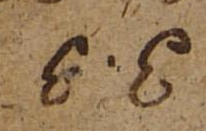3.3
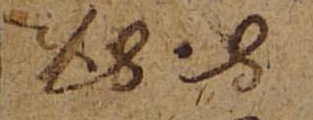8.8 1/2
